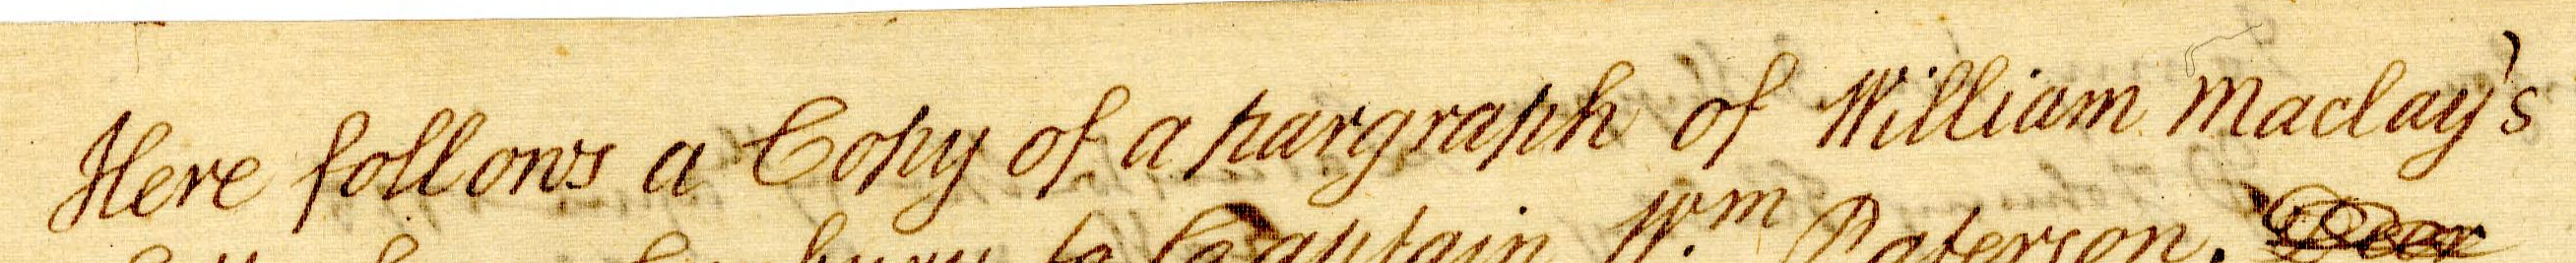Here follows a Copy of a pargraph of William Maclay's
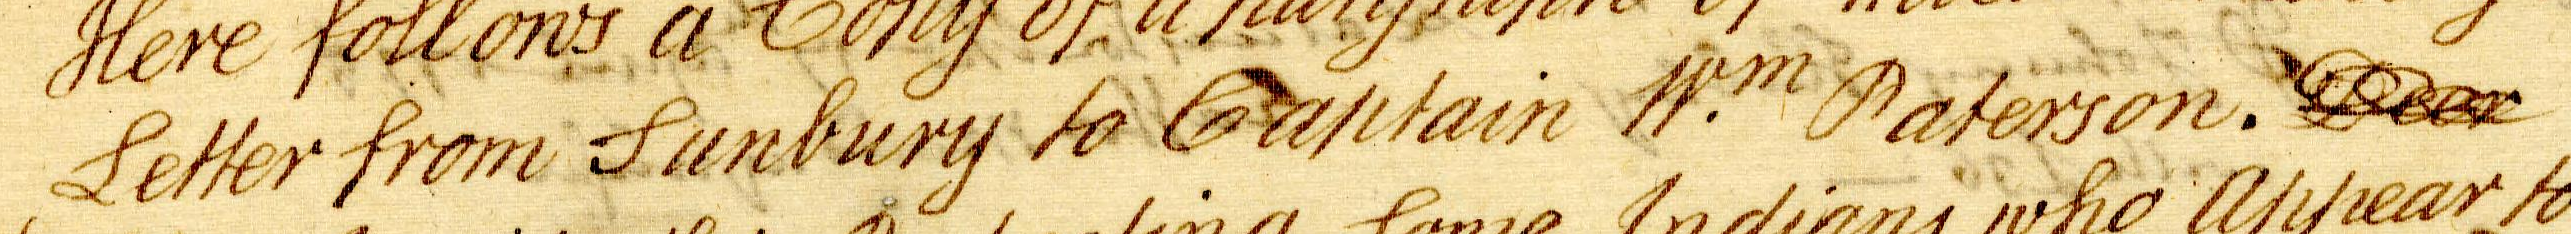Letter from Sunbury to Captain W.^m Paterson. [Dear]
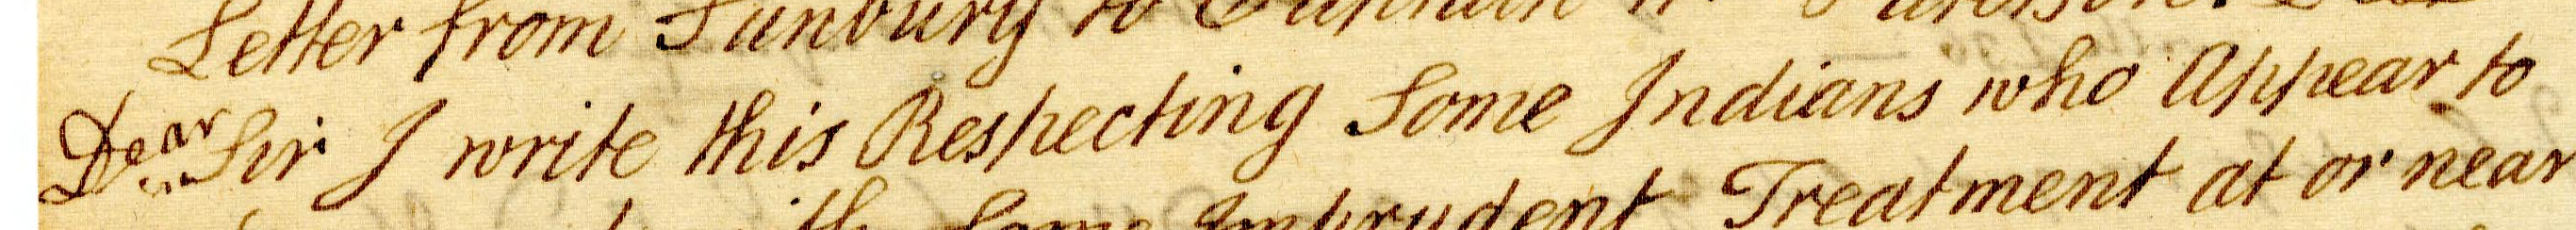D^ear Sir I write this Respecting Some Indians who Appear to
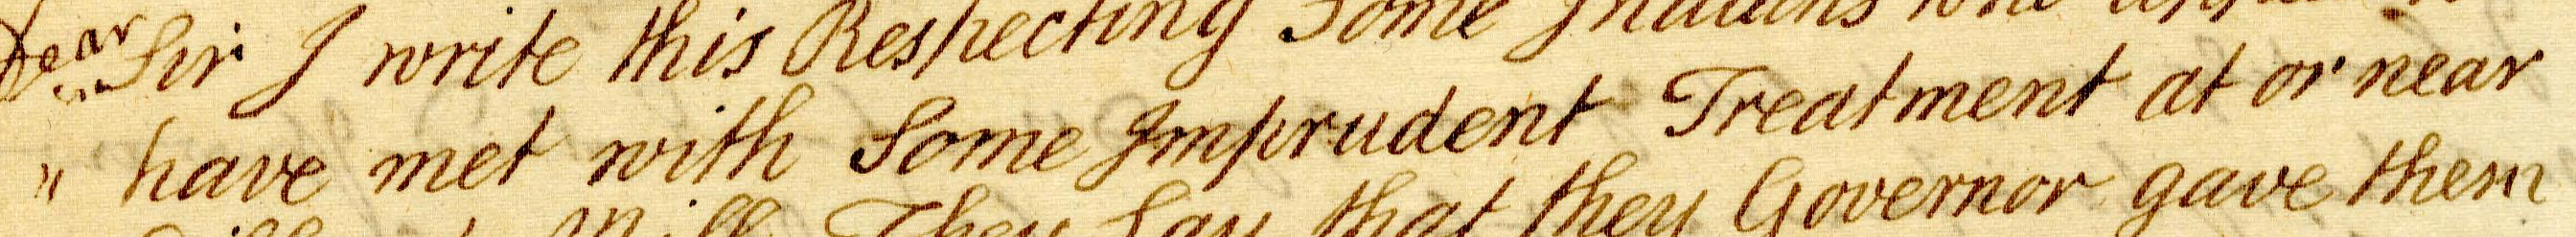"have met with Some Imprudent Treatment at or near
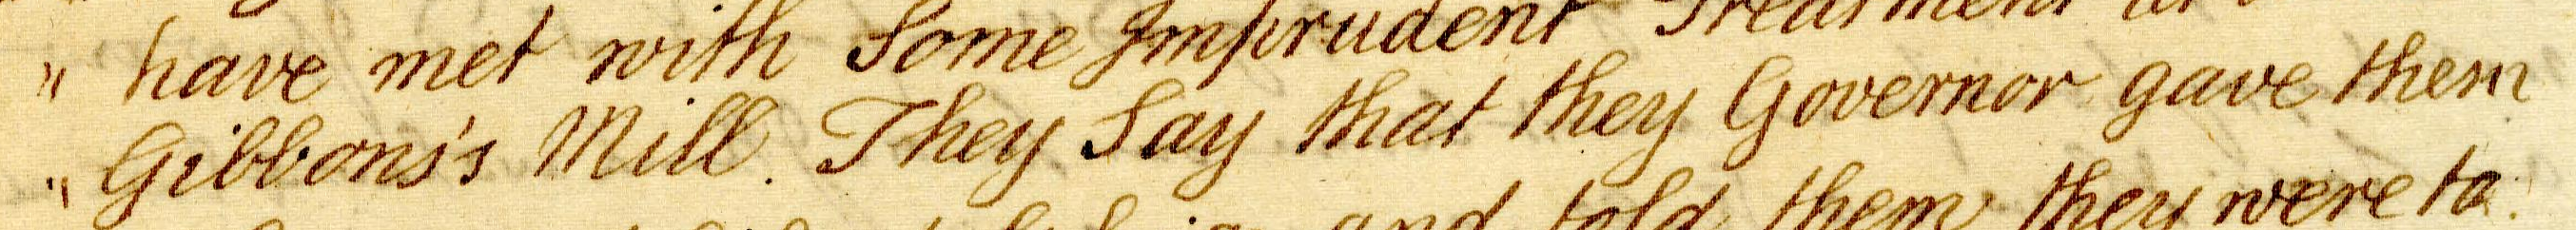"Gibbons's Mill. They Say that they Governor gave them
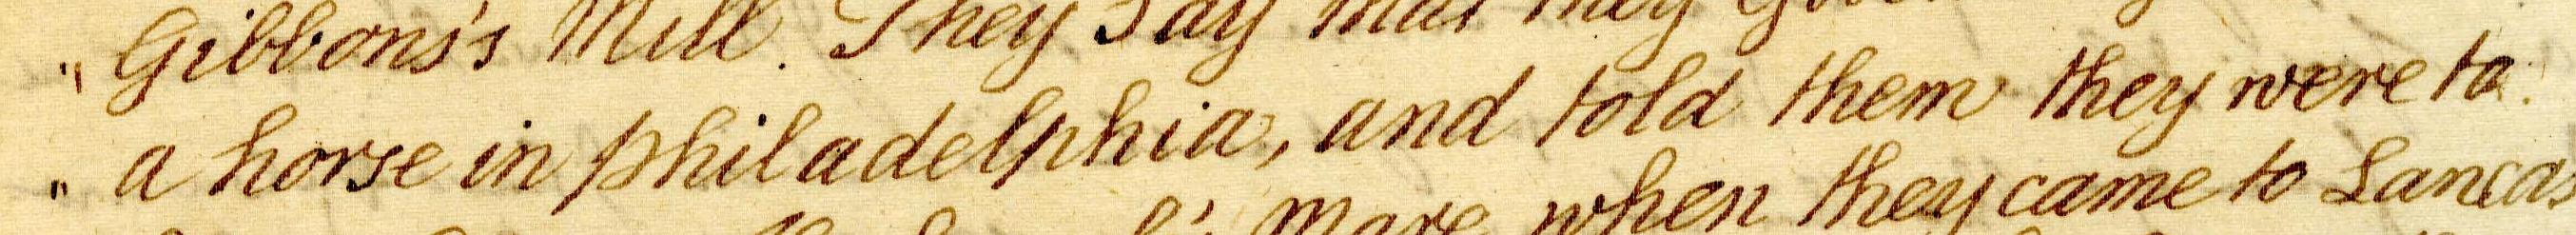"a horse in Philadelphia, and told them they were to
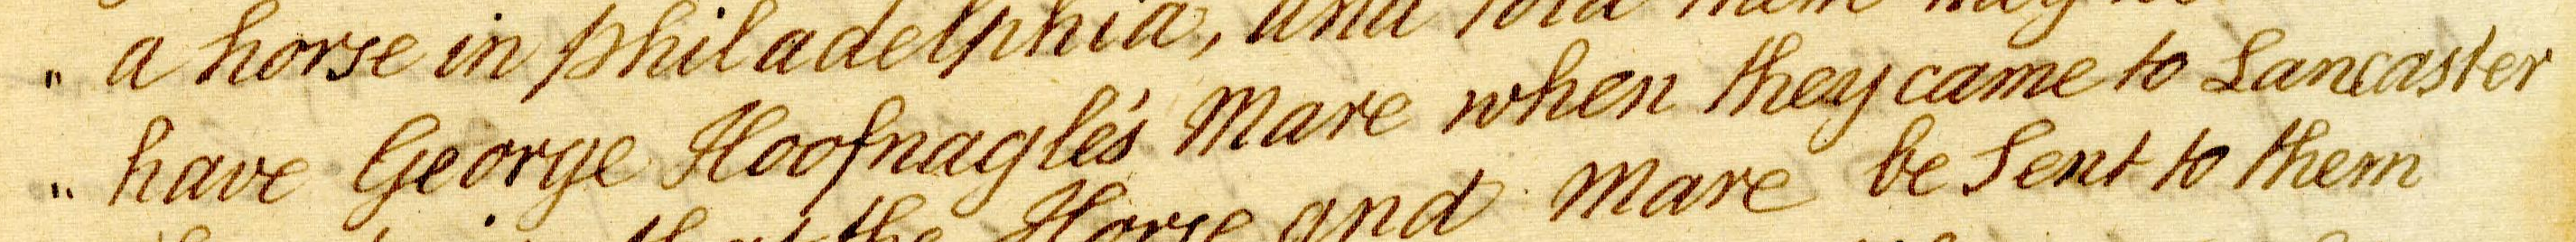"have George Hoofnagle's Mare when they came to Lancaster
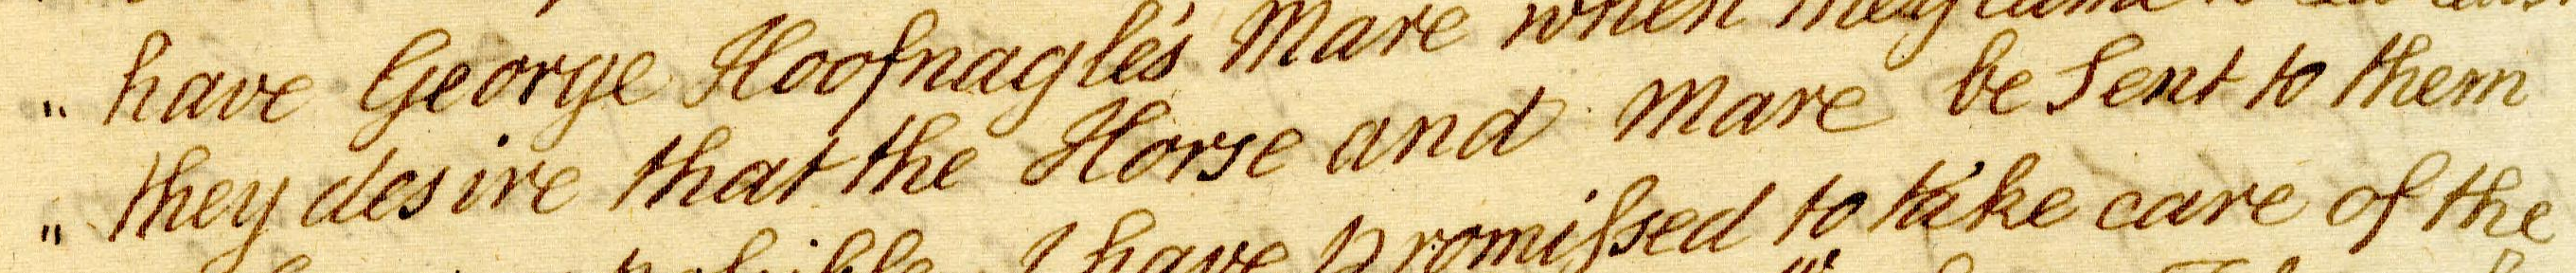"they desire that the Horse and Mare be Sent to them
